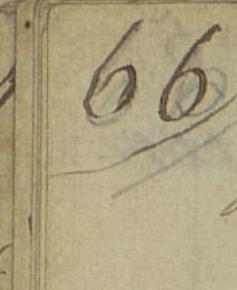66
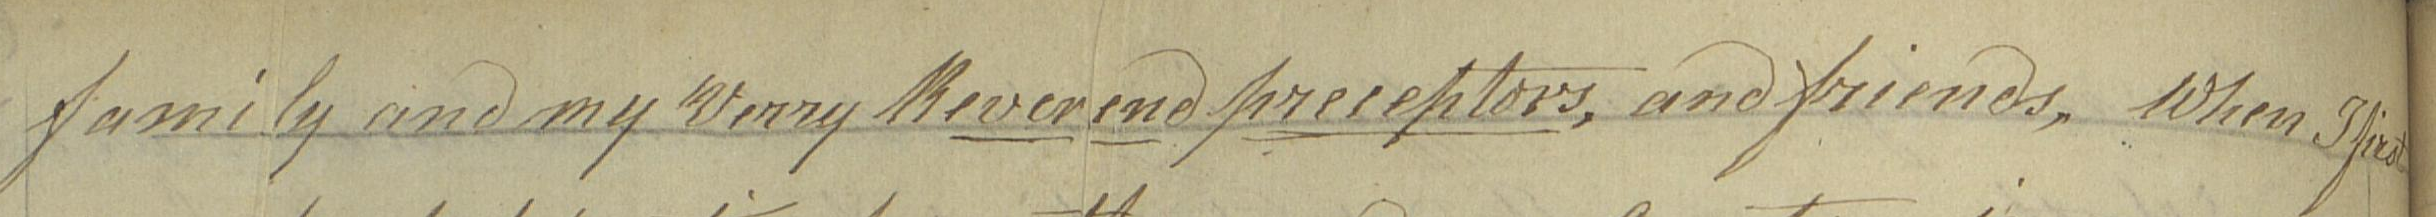family and my Verry Reverend preceptors and friends, When I first
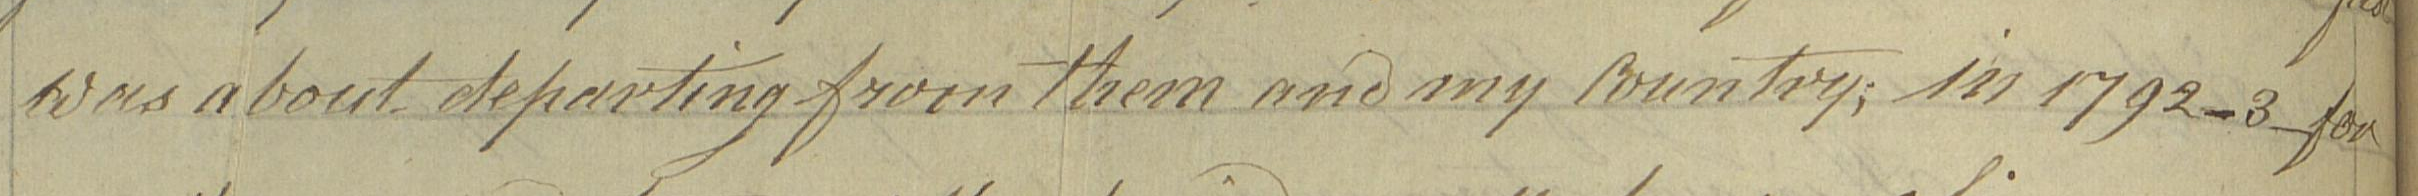was about departing from them and my Country; in 1792-3 for
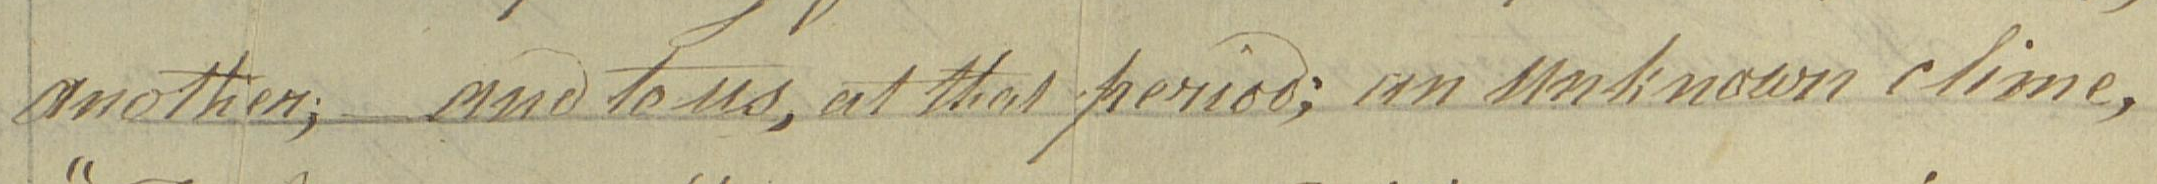mother; And to us, at that period; an unknown clime,
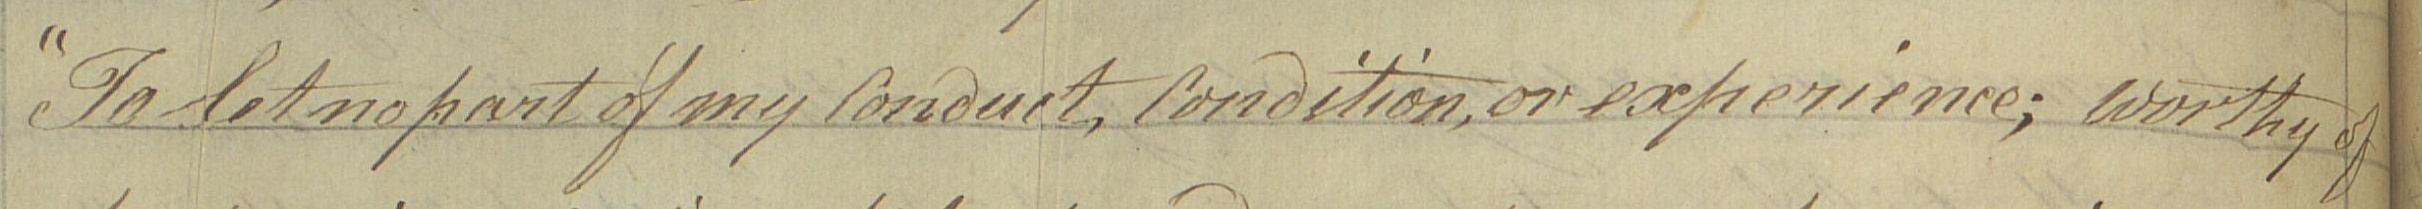"To let no part of my conduct, condition or experience; Worthy of
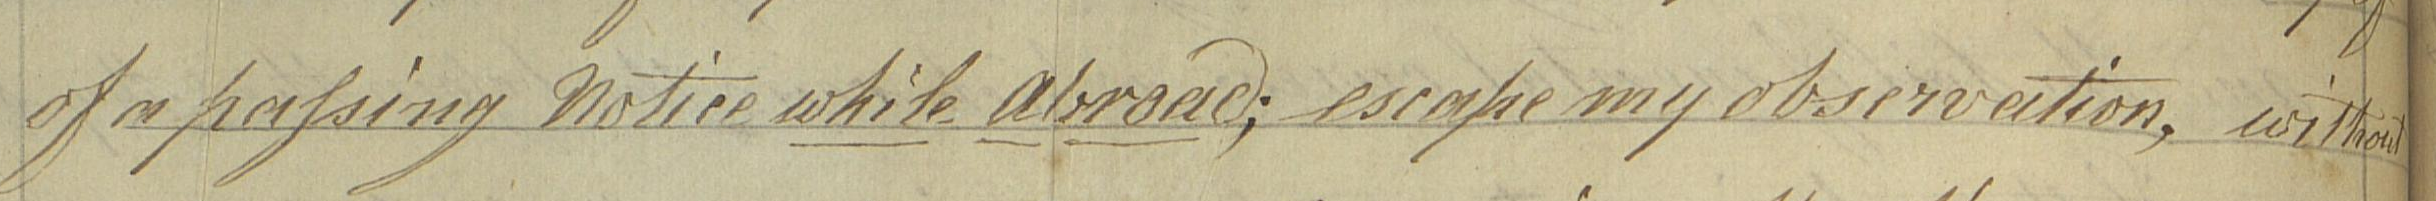of a passing Notice while abroad; escape my observation, without
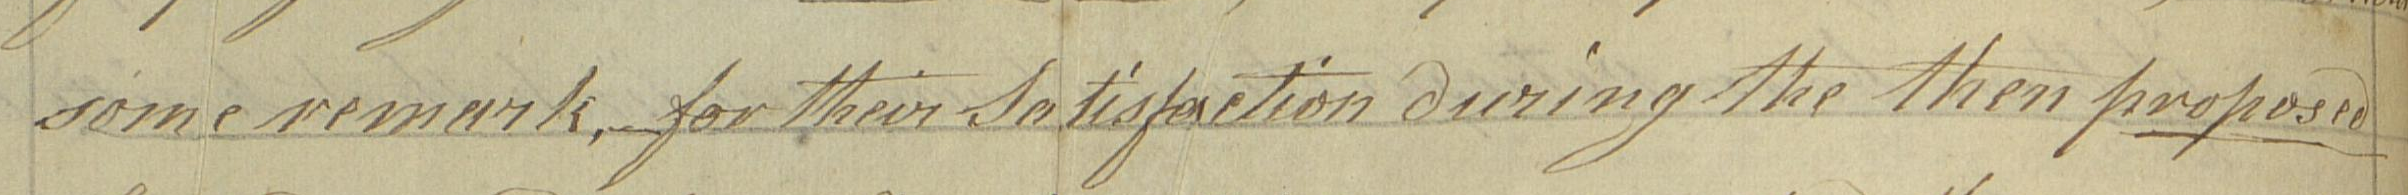some remark, for their satisfaction during the then proposed
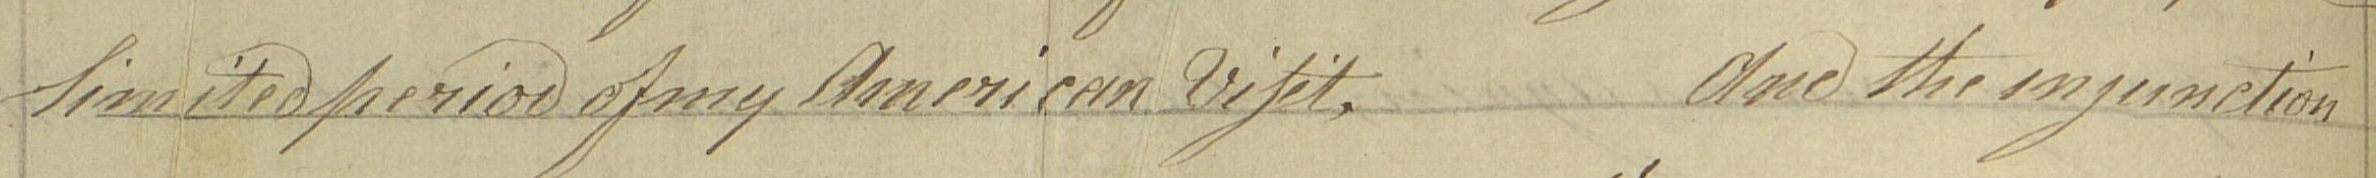limited period of my American Visit, And the injunction
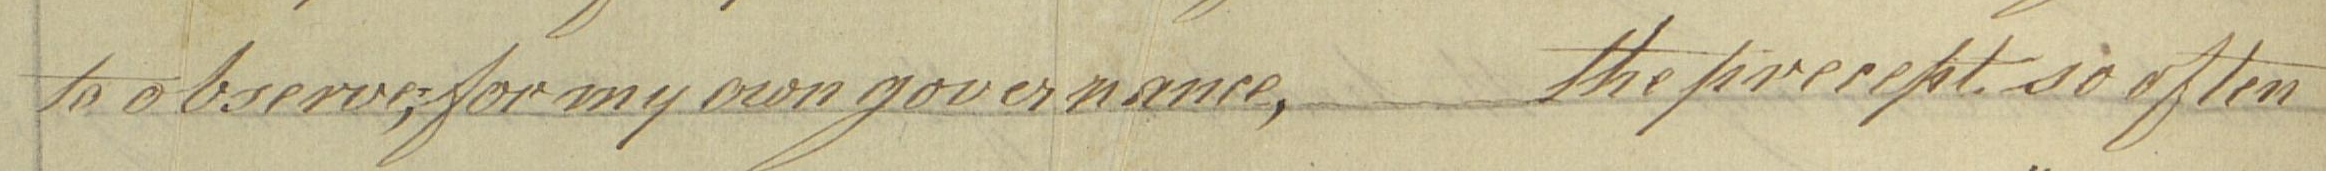to observe; for my own governance, the precept so often
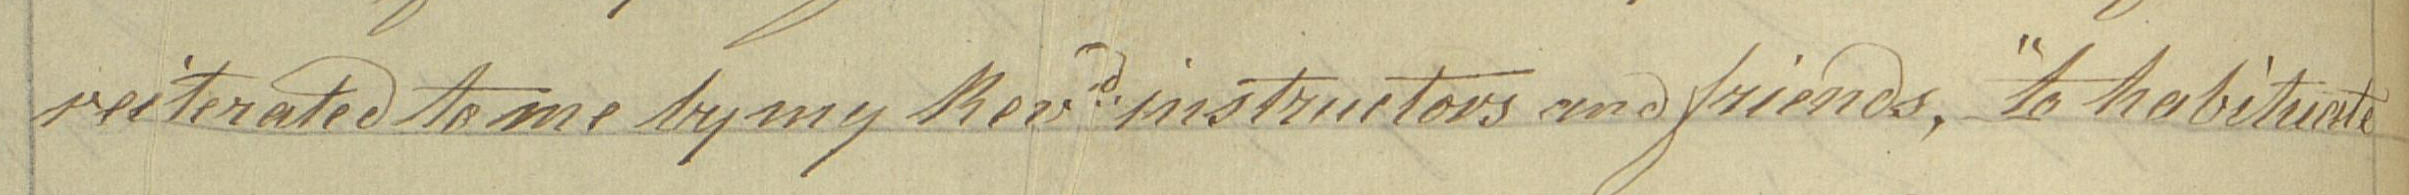reiterated to me by my Rev^d instructors and friends, "to habituate
